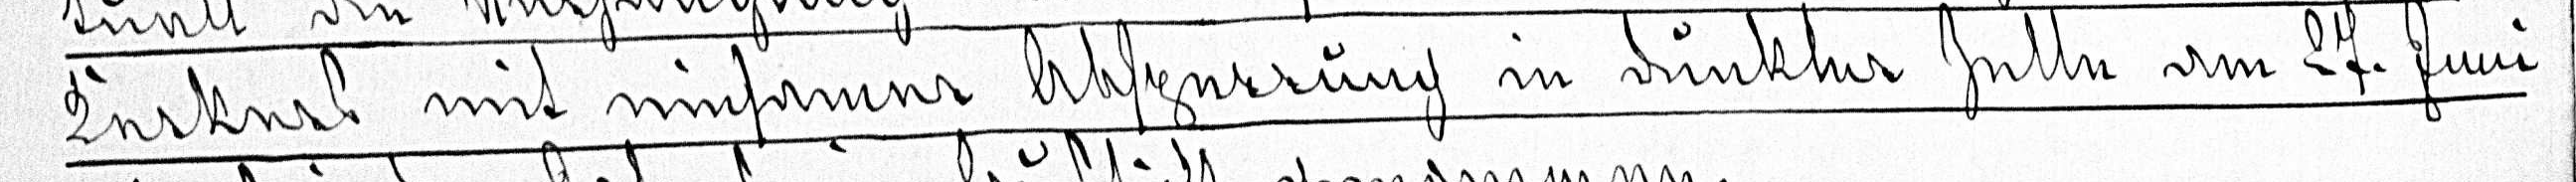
Kerkers mit einsamer Absperrung in dunkler Zelle am 27. Juni
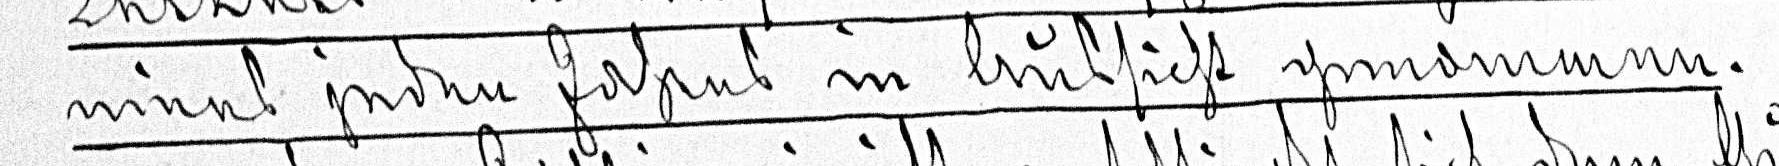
eines jeden Jahres in Aussicht genommen.
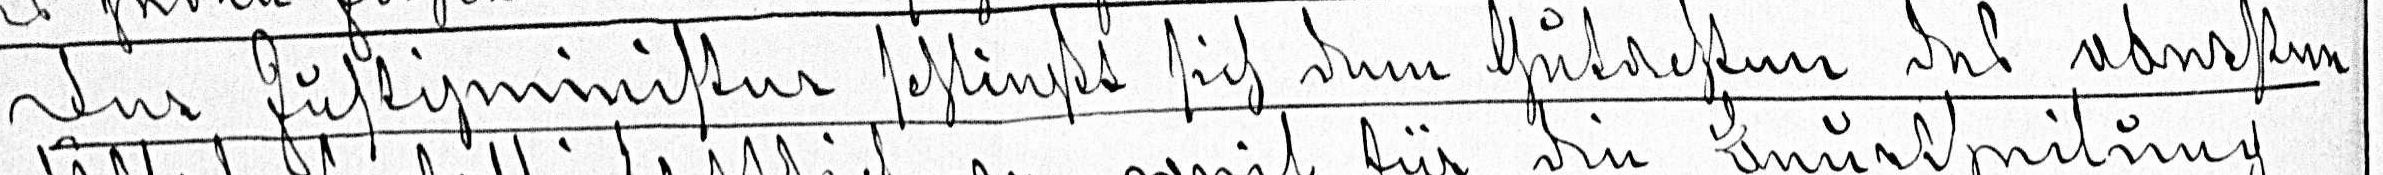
Der Justizminister schließ sich dem Gutachten des obersten
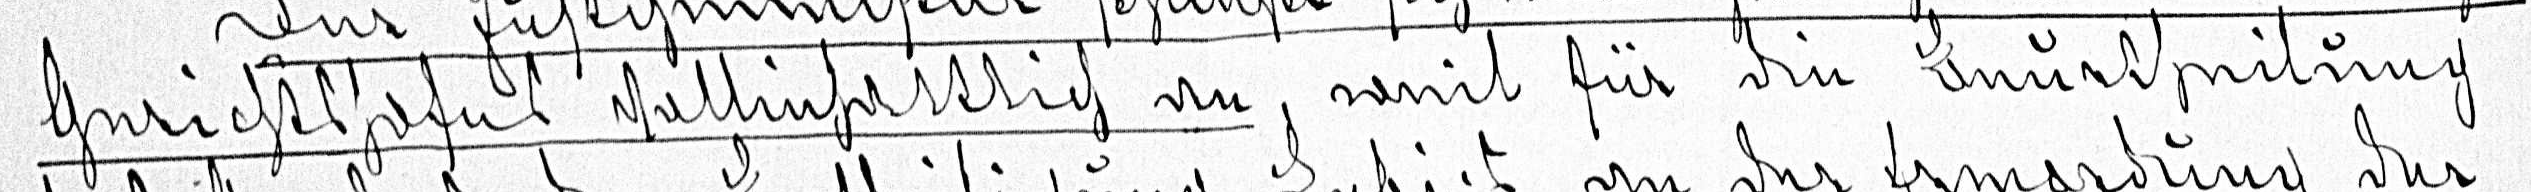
Gerichtshofes vollinhaltlich an, weil für die Beurtheilung
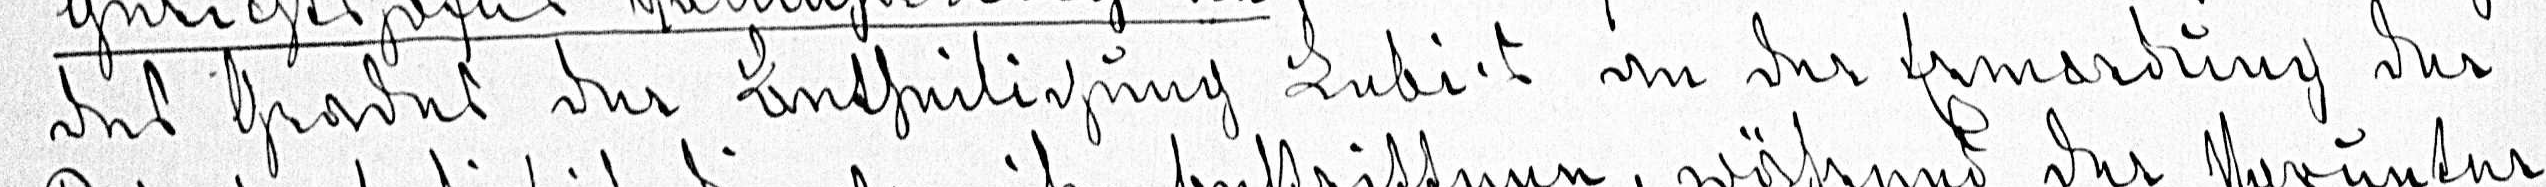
des Grades der Betheiligung Lubi’s an der Ermordung der
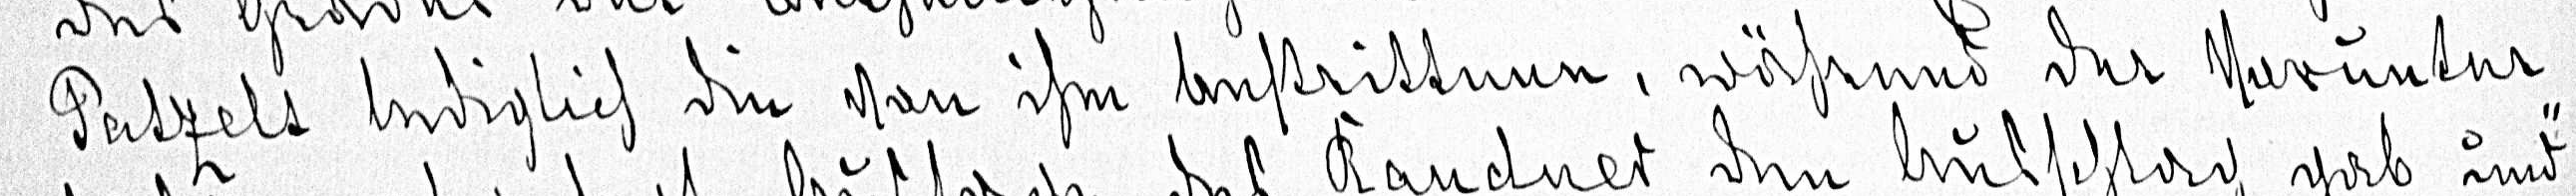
Patzels lediglich die von ihm bestrittene, während der Verunter¬
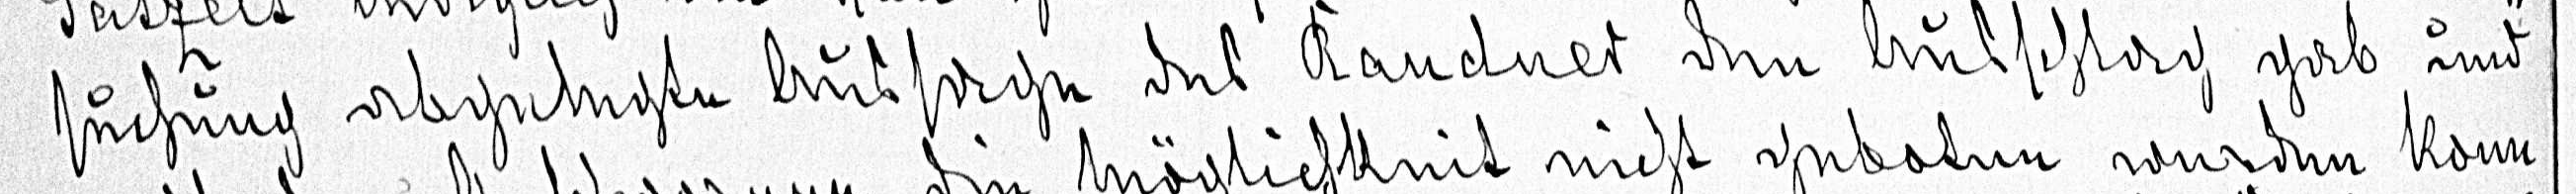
suchung abgelegte Aussage des Raudner den Ausschlag gab und
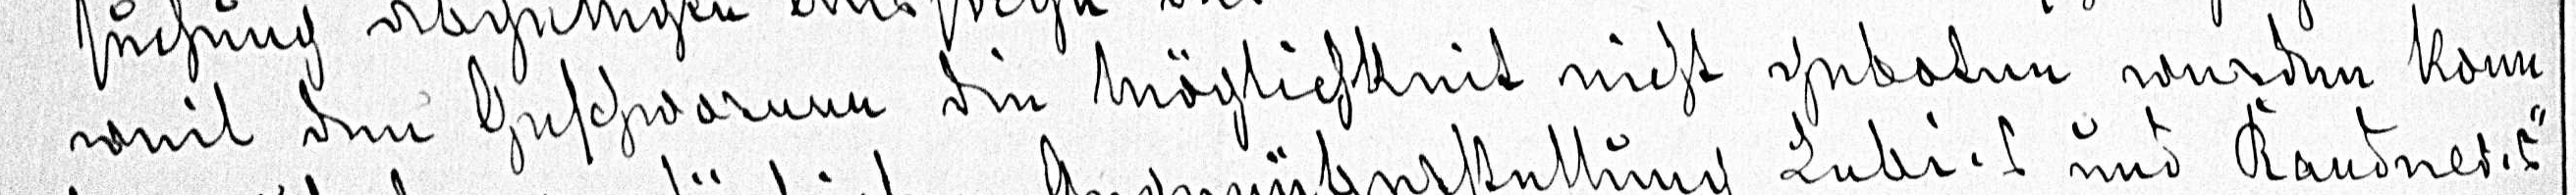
weil den Geschworenen die Möglichkeit nicht geboten wurden kann¬
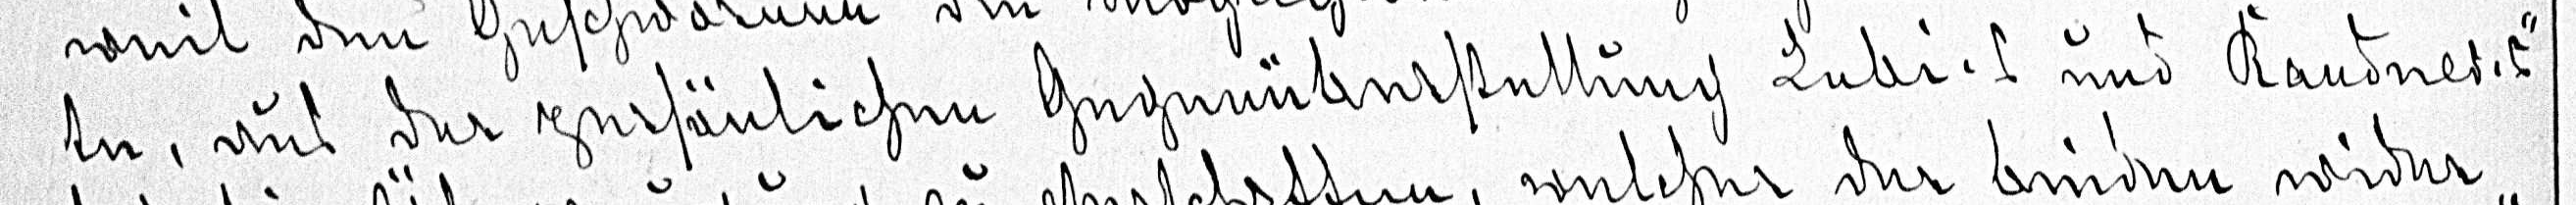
te, aus der persönlichen Gegenüberstellung Lubi’s und Raudner’s
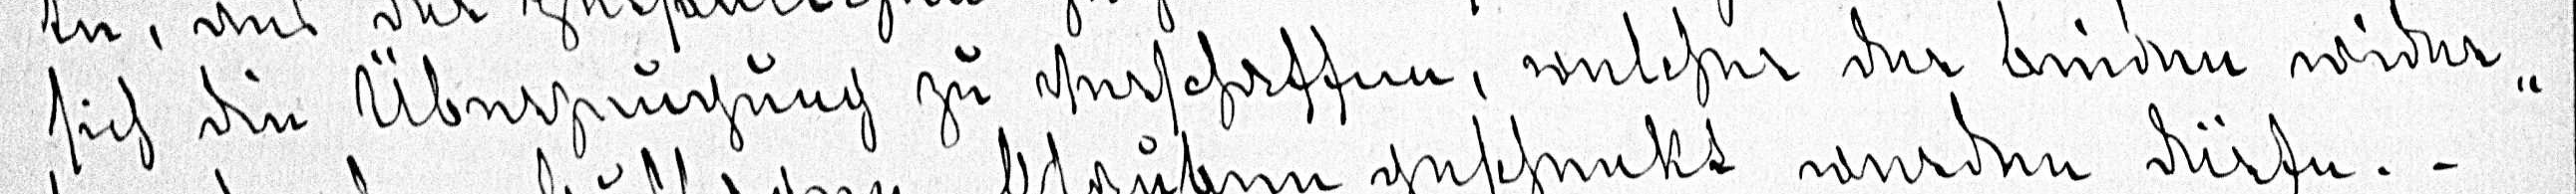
sich die Überzeugung zu verschaffen, welcher der beiden wider¬
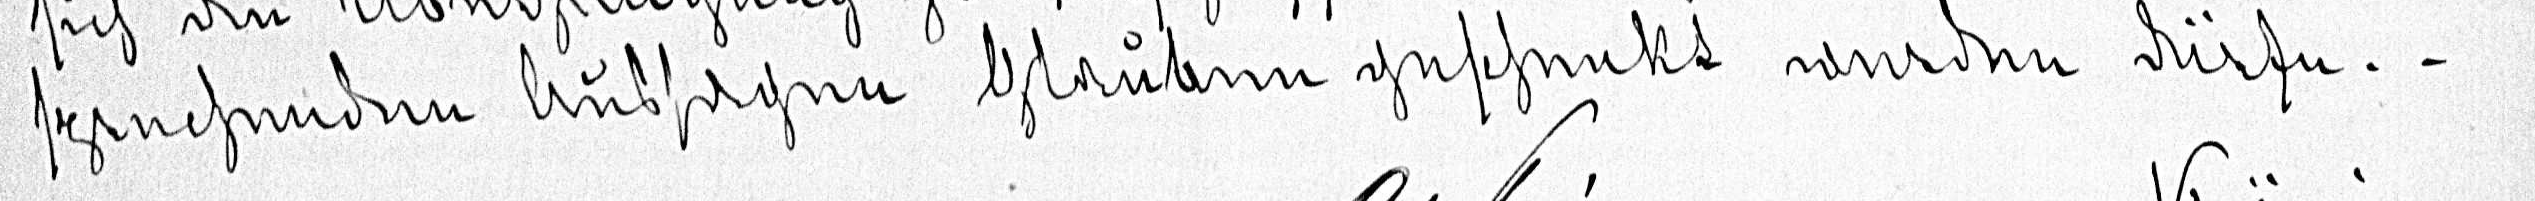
sprechenden Aussagen Glauben geschenkt werden dürfe.
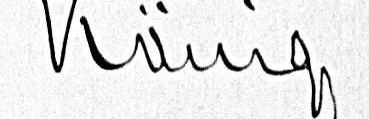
König
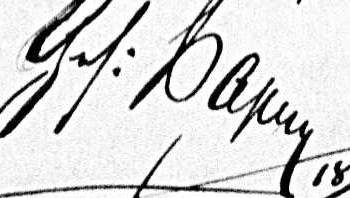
Ges. Papay
